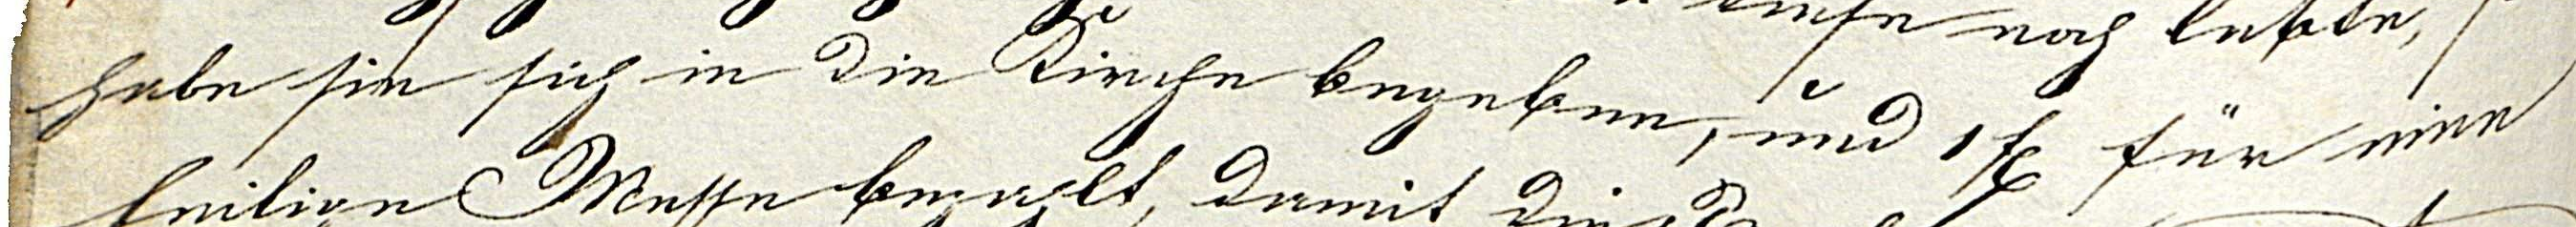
habe sie sich in die Kirche begeben, und 1 xx für eine
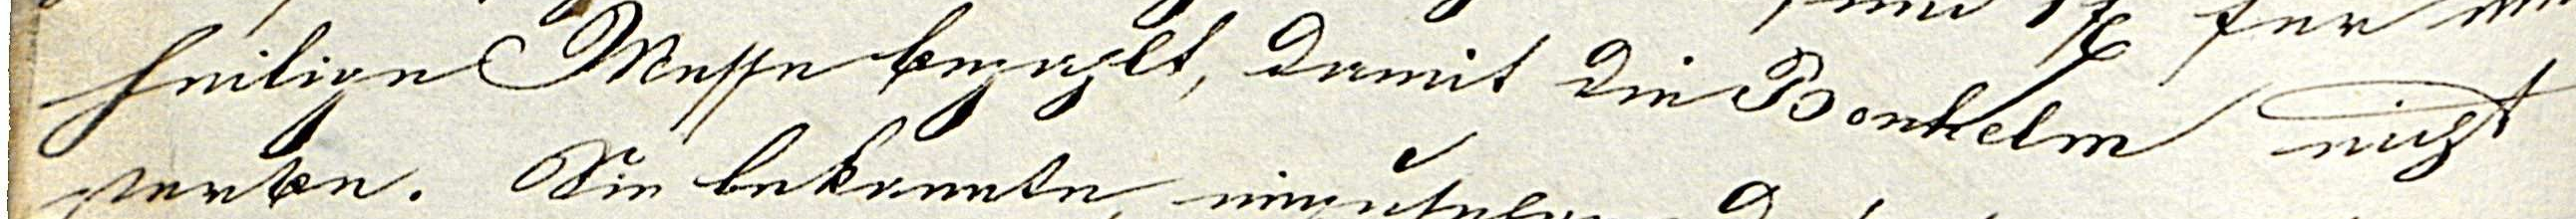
heilige Messe bezahlt, damit die Bonhelm nicht
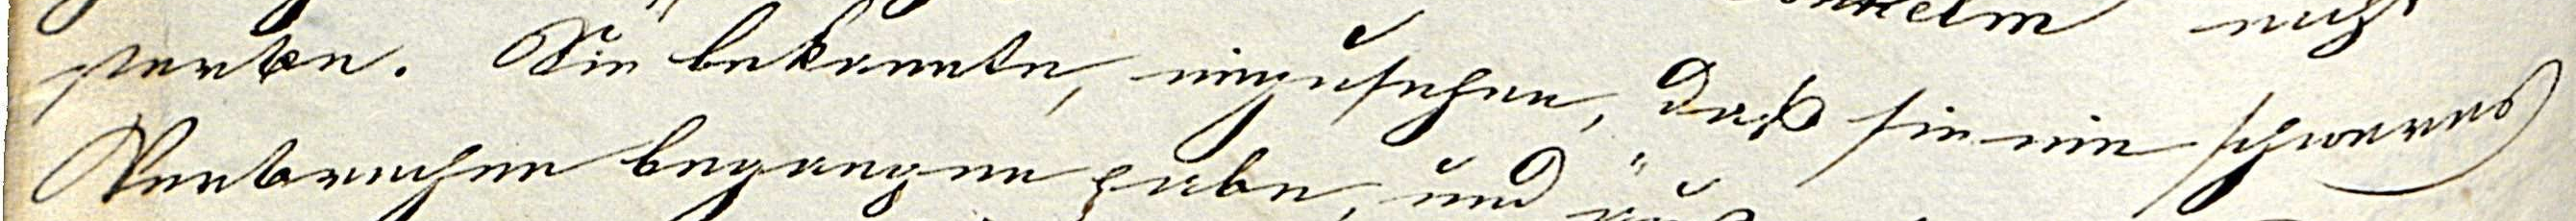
sterbe. Sie bekannte, einzusehen, daß sie ein schweres
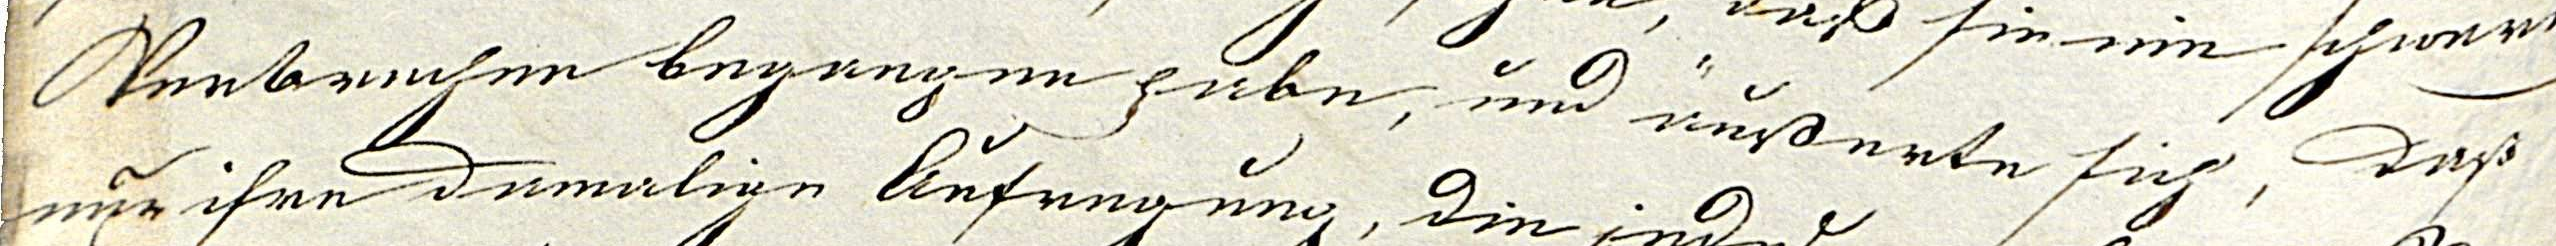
Verbrechen begangen habe, und äußerte sich, daß
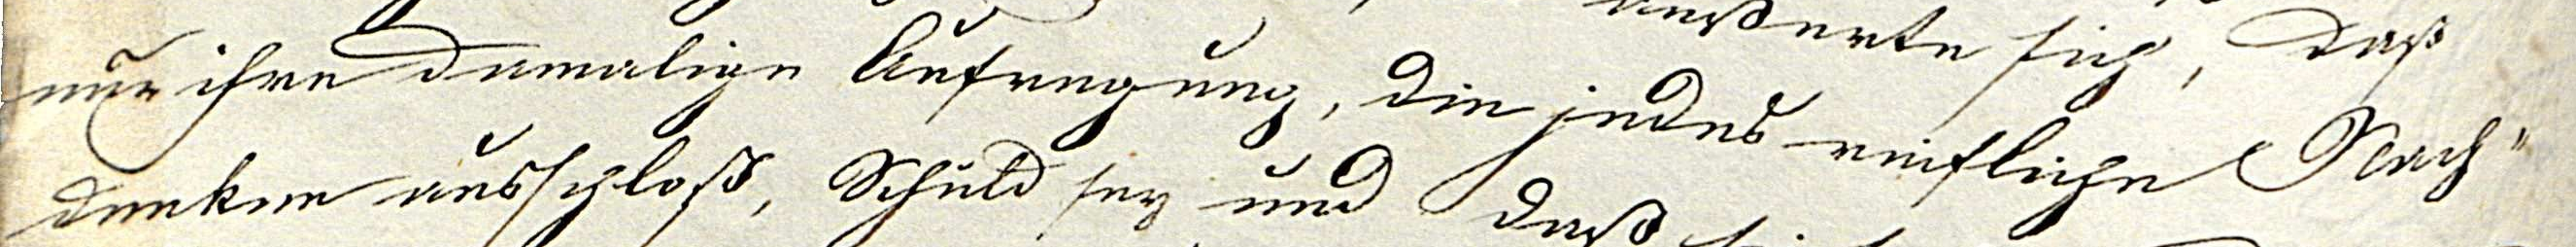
nur ihre damalige Auftragung, die jedes reifliche Nach¬
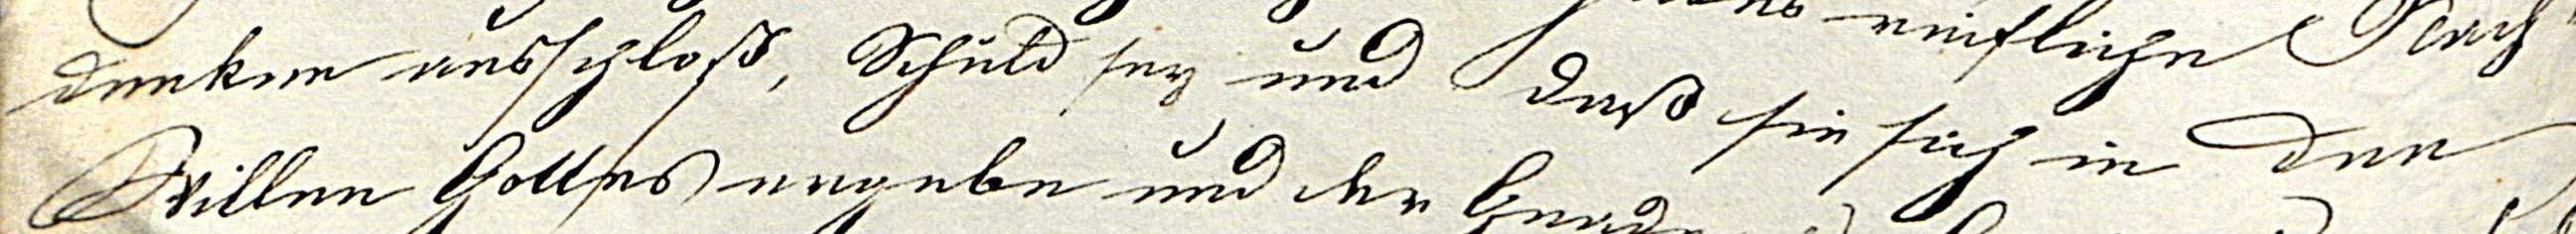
denken ausschloß, Schuld sey und daß sie sich in den
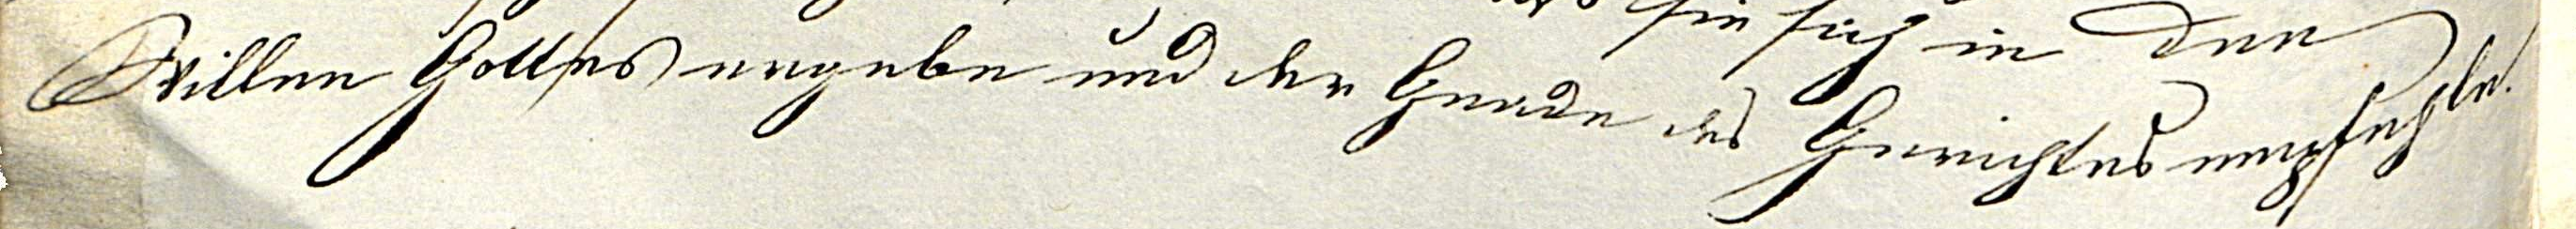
Willen Gottes ergebe und der Gnade des Gerichtes empfehle.
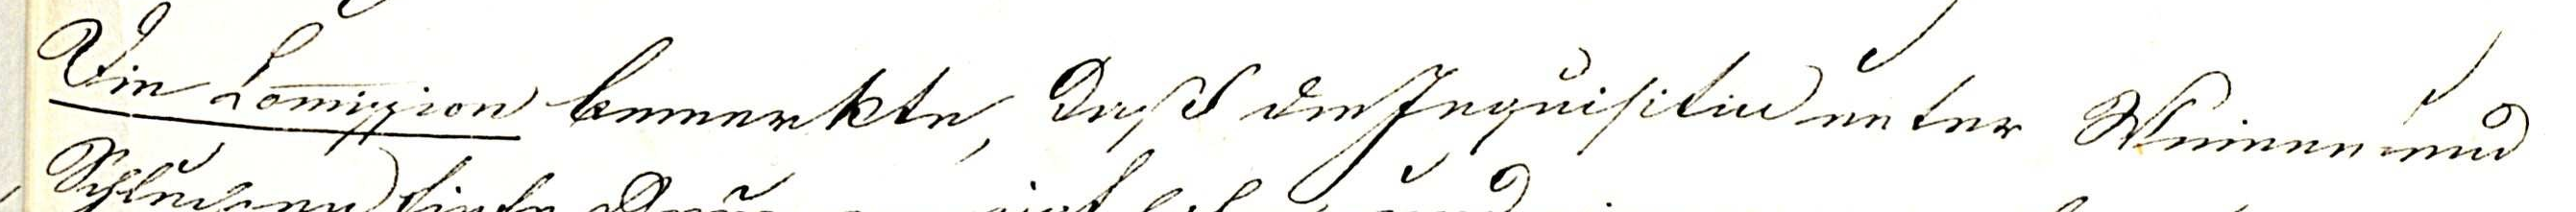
Die Commission bemerkte, daß die Jnquisitin unter Weinen und
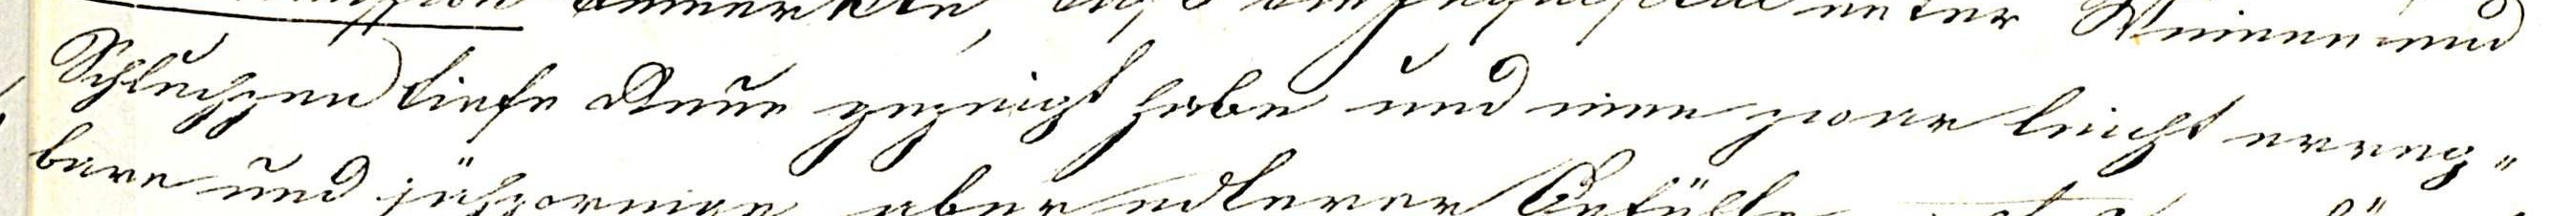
Schluchzen tiefe Reue gezeigt habe und eine zwar leicht erreg¬
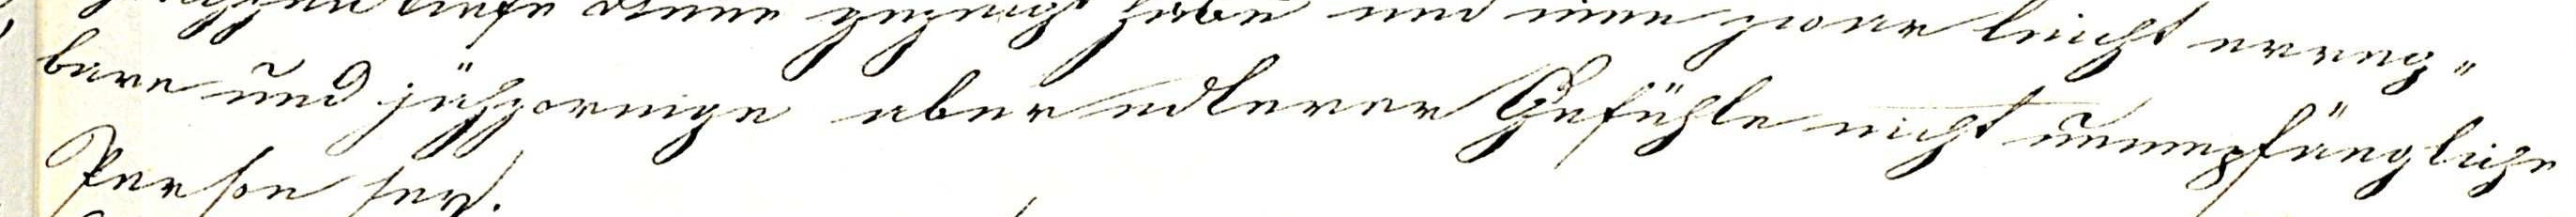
bare und jähzornige aber edlerer Gefühle nicht unempfängliche
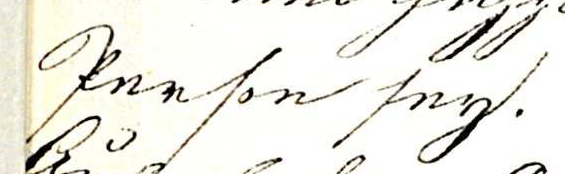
Person sey.
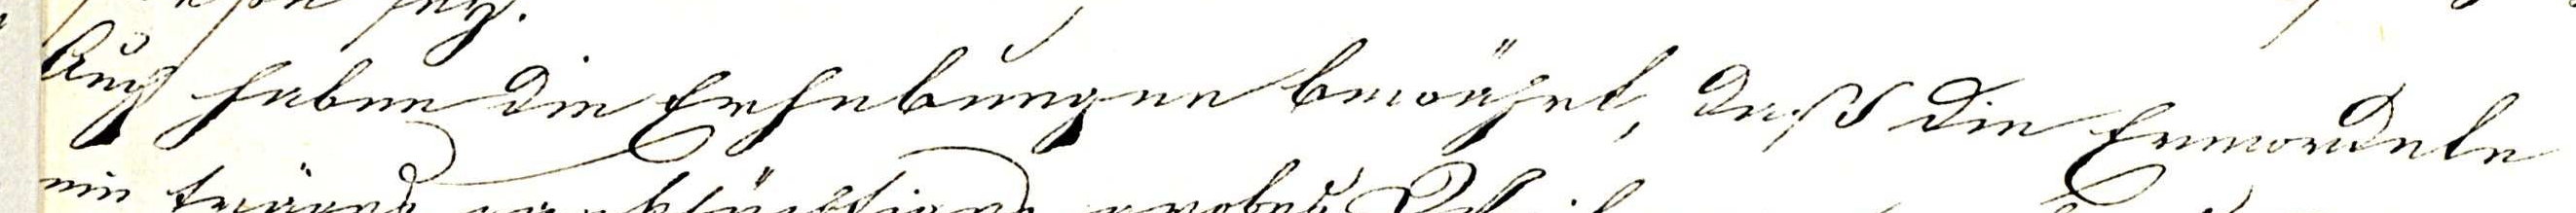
Auch haben die Erhebungen bewährt, daß die Ermordete
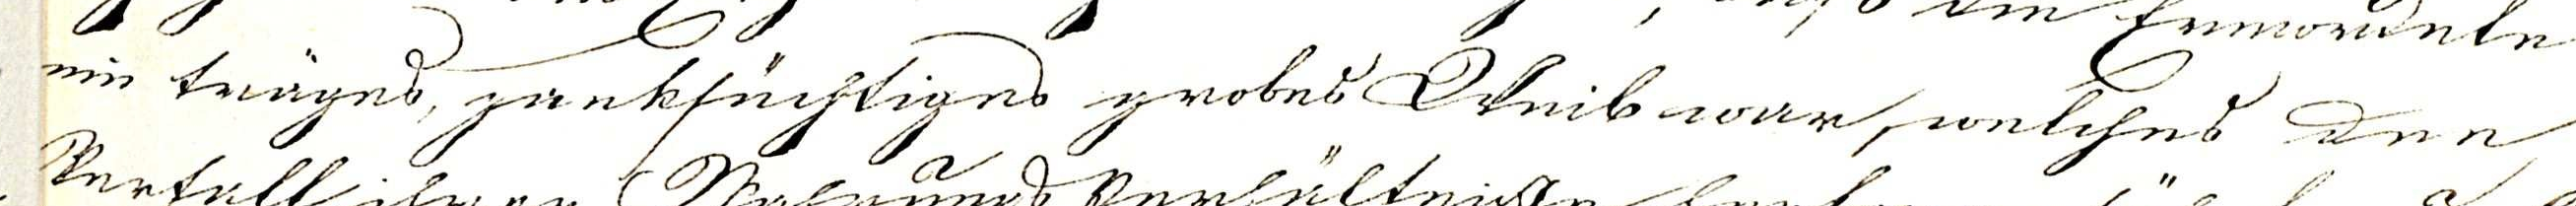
ein träges, zanksüchtiges grobes Weib war, welches den
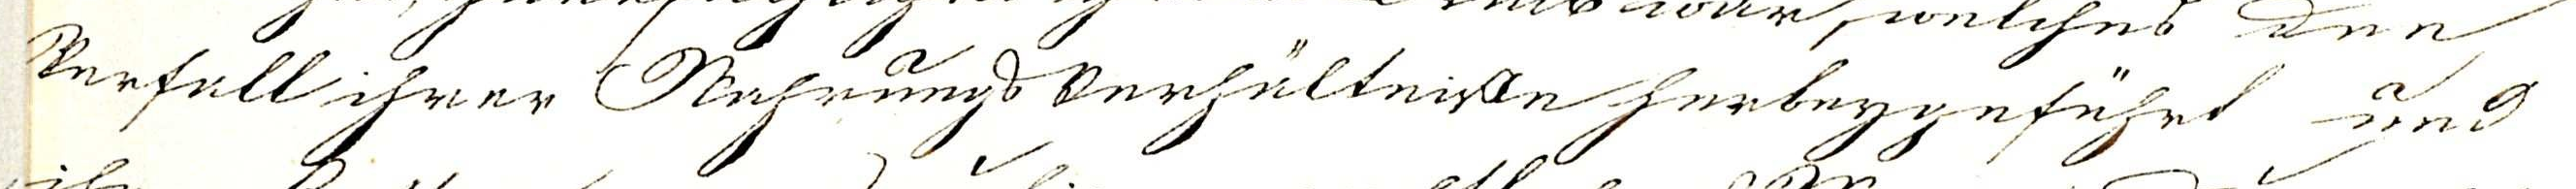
Verfall ihrer Nahrungsverhältniße herbeygeführt und
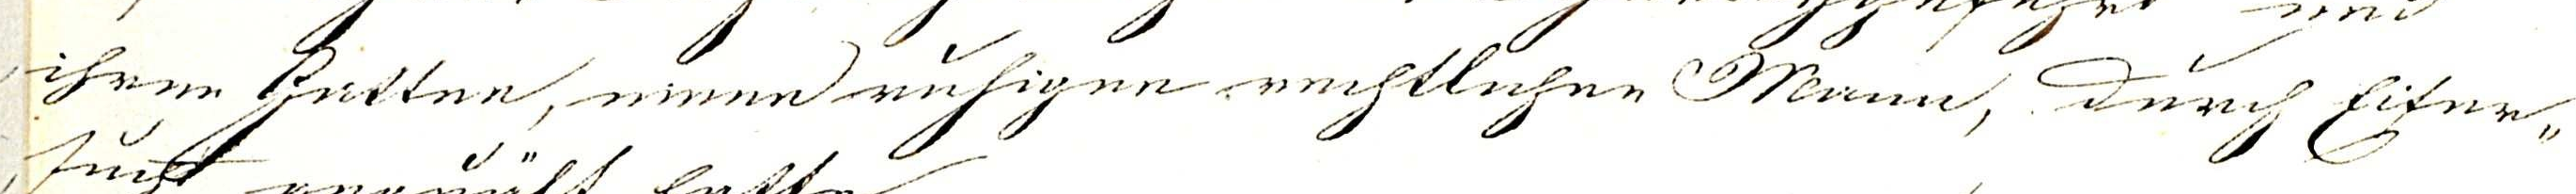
ihren Gatten, einen ruhigen rechtlichen Mann, durch Eifer¬
